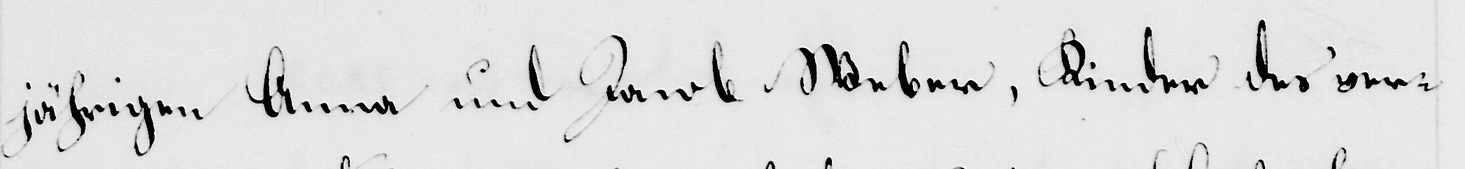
jährigen Anna und Jacob Weber, Kinder des ver¬
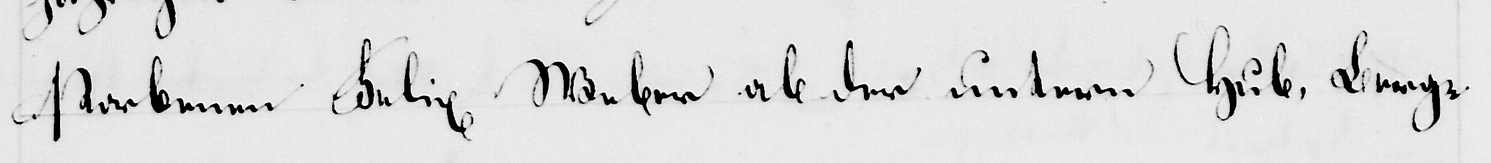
storbenen Felix Weber ab der untern Hub, Berg¬
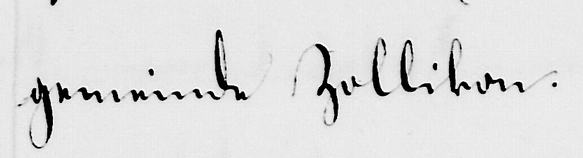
gemeinde Zollikon.
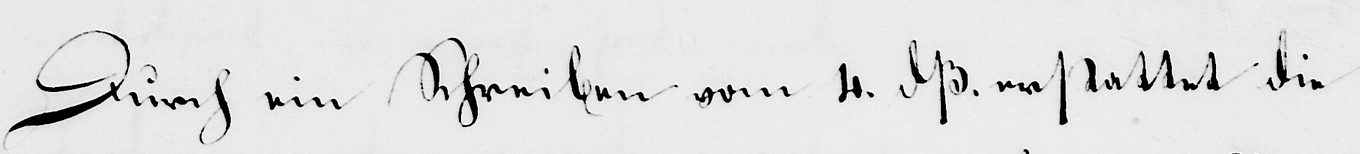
Durch ein Schreiben vom 14. dß. erstattet die
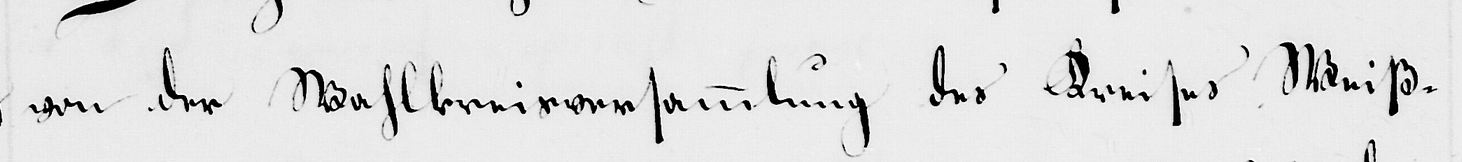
von der Wahlkreisversammlung des Kreises Weiß¬
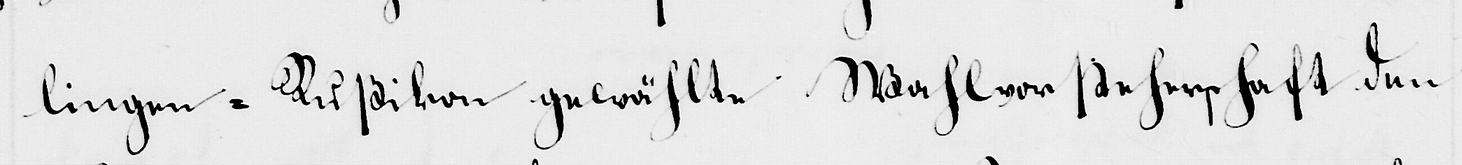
lingen-Rußikon gewählte Wahlvorsteherschaft den
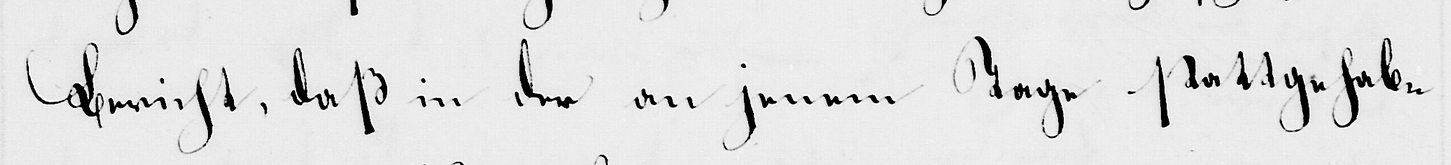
Bericht, daß in der an jenem Tage stattgehab¬
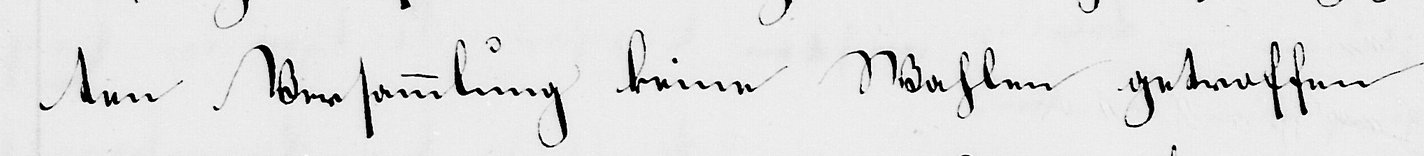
ten Versammlung keine Wahlen getroffen
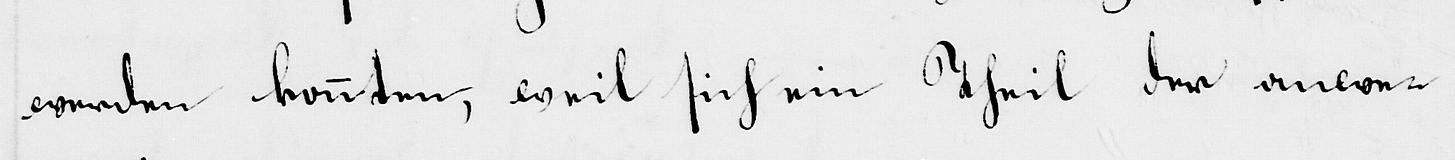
werden konnten, weil sich ein Theil der anwe¬
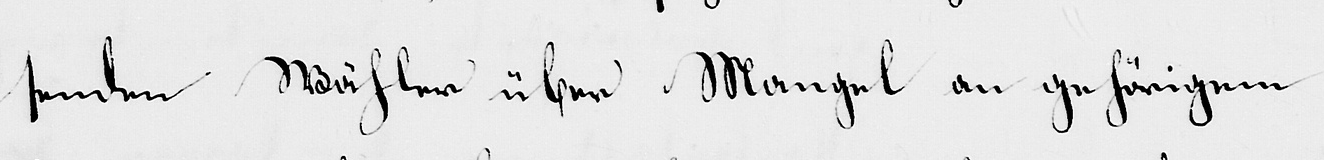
senden Wähler über Mangel an gehörigem
